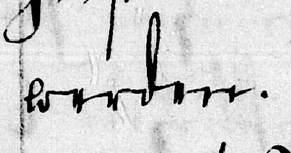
werden.
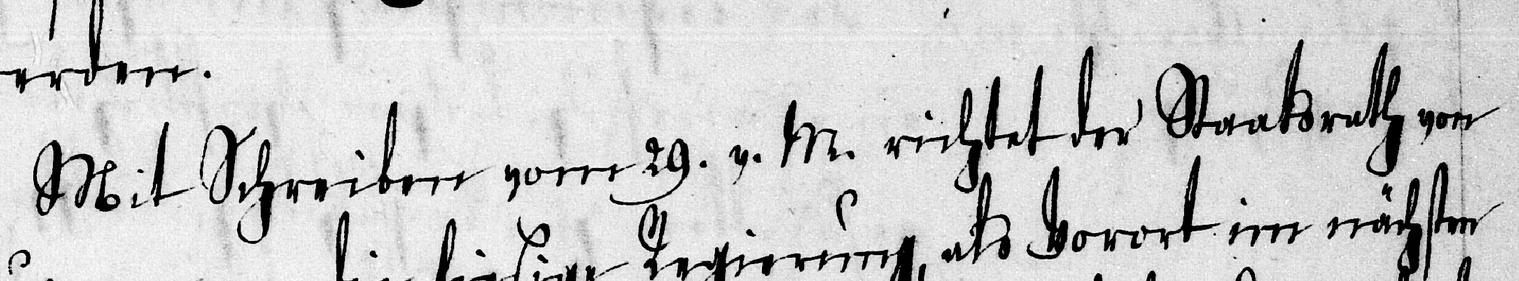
Mit Schreiben vom 29. v. M. richtet der Staatsrath von
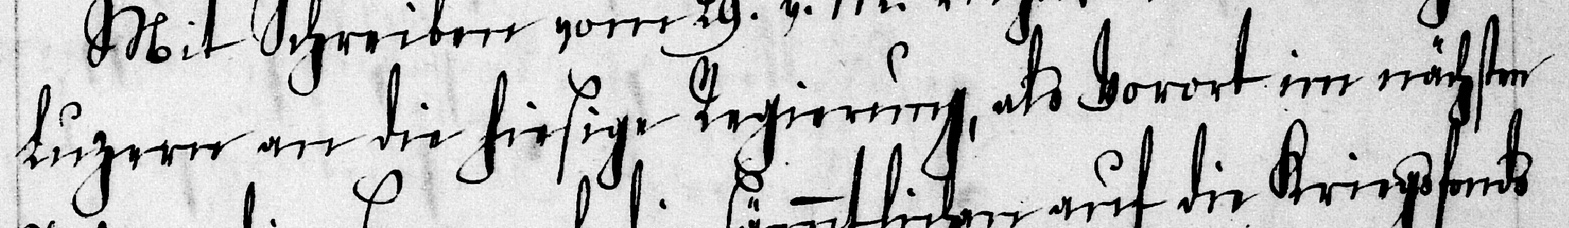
Luzern an die hiesige Regierung, als Vorort im nächsten
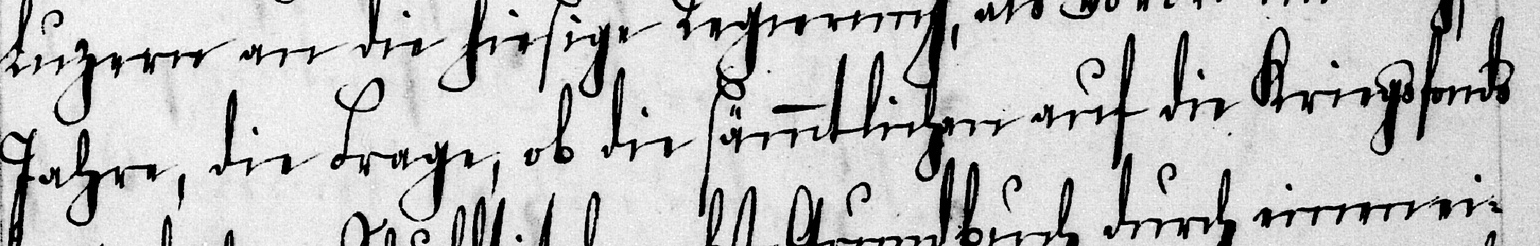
Jahre, die Frage, ob die sämmtlichen auf die Kriegsfonds
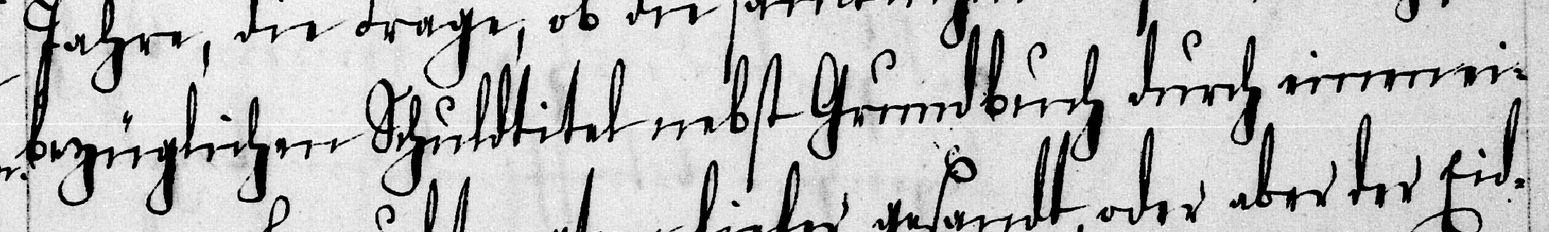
bezüglichen Schuldtitel nebst Grundbuch durch einen ei¬
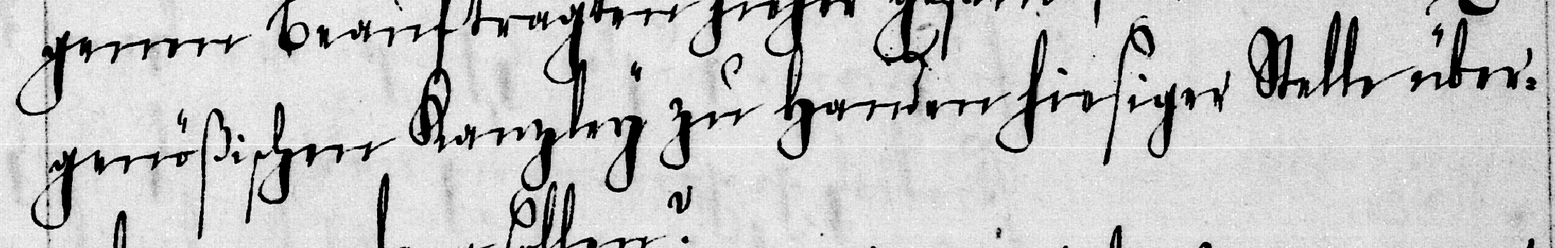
genößischen Kanzley zu Handen hiesiger Stelle über¬
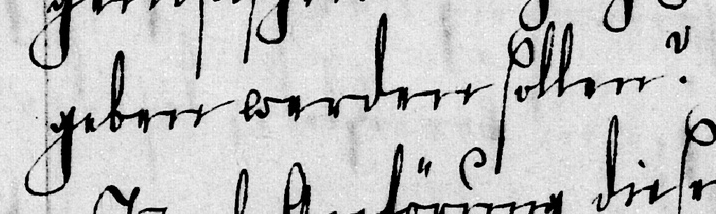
geben werden sollen?
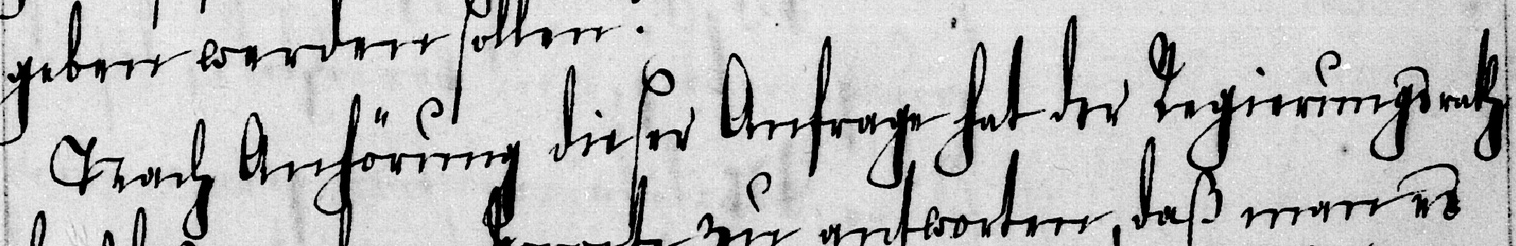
Nach Anhörung dieser Anfrage hat der Regierungsrath
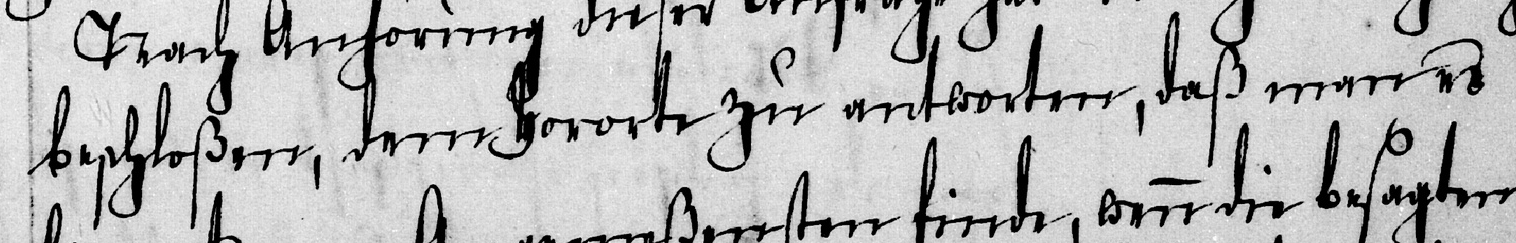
beschloßen, dem Vororte zu antworten, daß man es
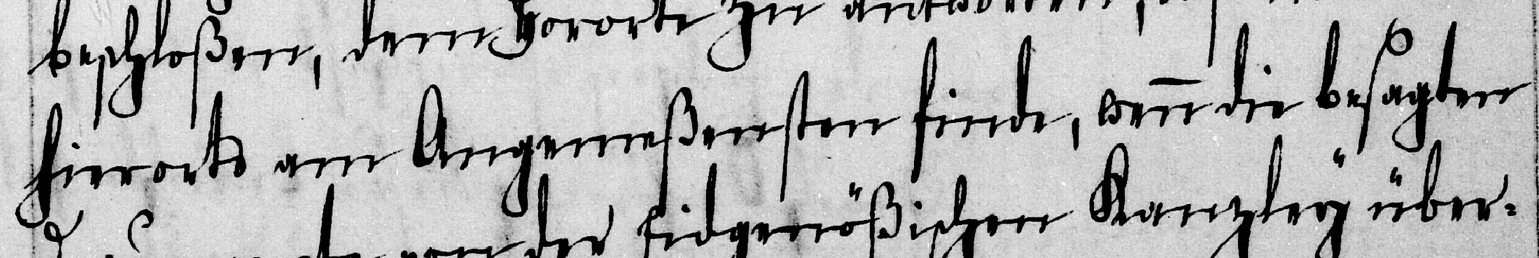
hierorts am Angemeßensten finde, wenn die besagten
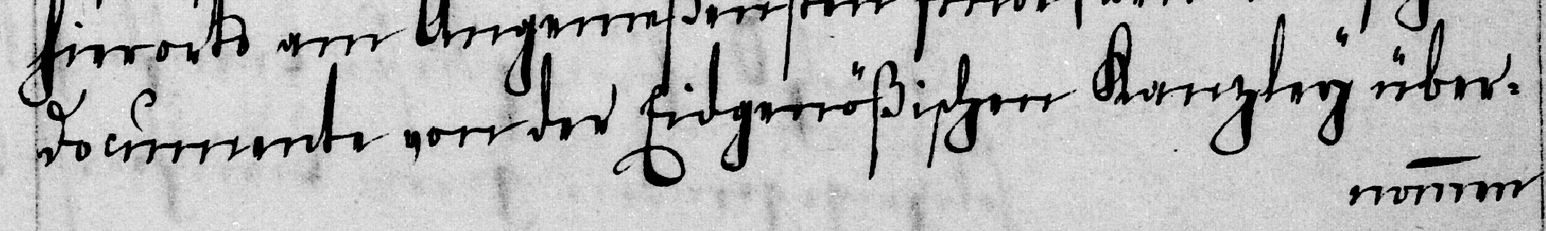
Documente von der Eidgenößischen Kanzley über-
